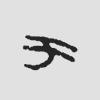于
